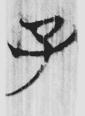子
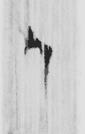人
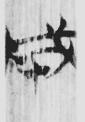成
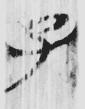子
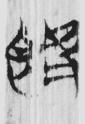既
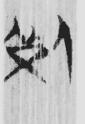死
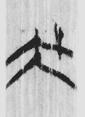太
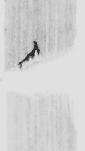白
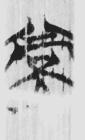當
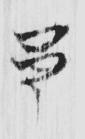邑
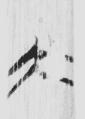太
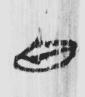白
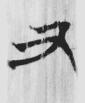又
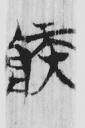疾
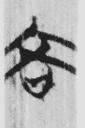吝
